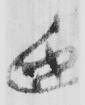臣
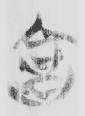合
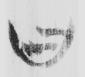曰
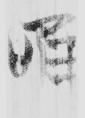唯
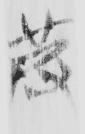皮
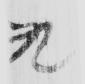九
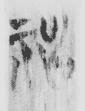神
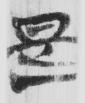是
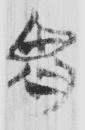胃
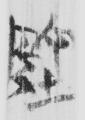地
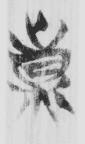{之鼎}
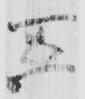五
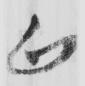㠯（以）
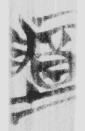{𨟻止}
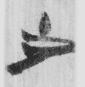之
